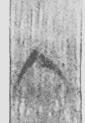六
